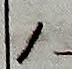1
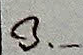3.
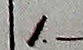1.
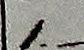1.
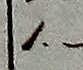1.
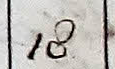18.
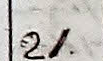21.
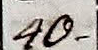40
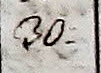30.
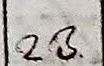23.
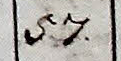57.
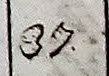37.
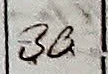30
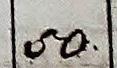50.
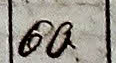60
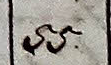55.
